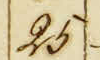25
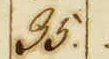35.
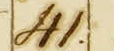41.
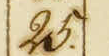25.
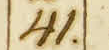41.
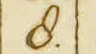8.
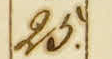25.
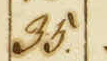35.
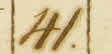41.
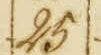25´
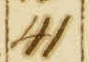41
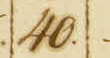40.
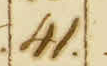41.
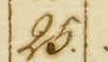25.
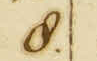8.
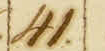41.
